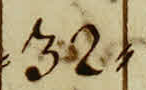32
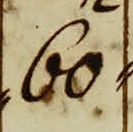60
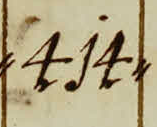414
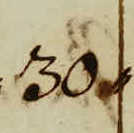30
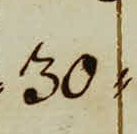30
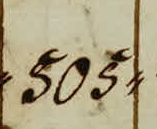505
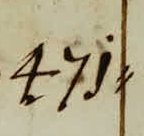471
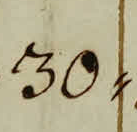30
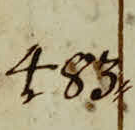483
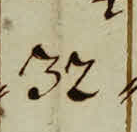32
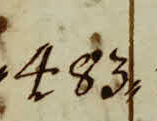483
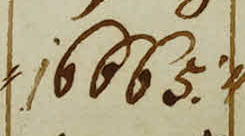16665.
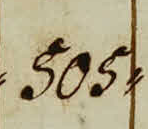505
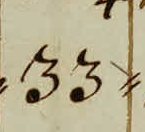33
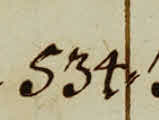534
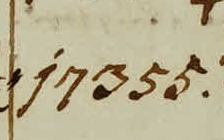17355
